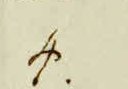4.
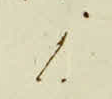1.
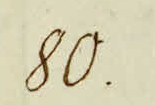80.
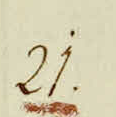21.
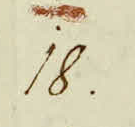18.
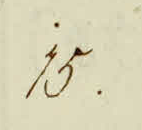15.
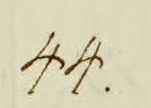44.
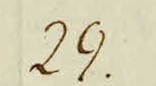29.
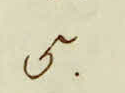5.
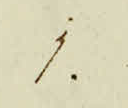1.
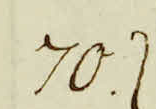70.
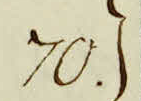70.
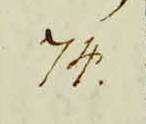74.
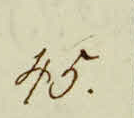45.
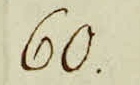60.
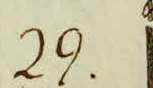29.
